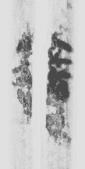善
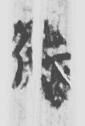弼
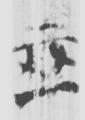亞
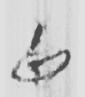㠯（以）
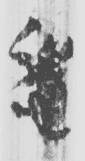𢝊
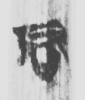君
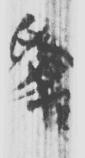{爪家}
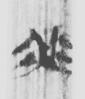非
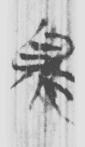蜀
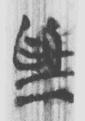爲
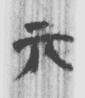亓
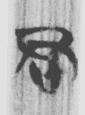君
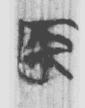医
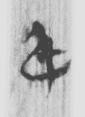身
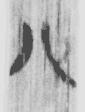八
